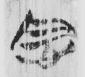念
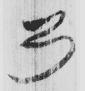乃
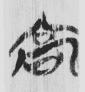高
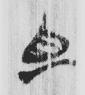且
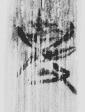尅
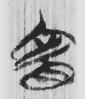{𫲸目}
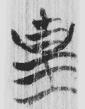皇
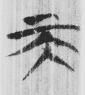天
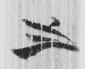之
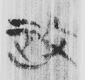政
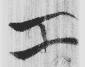工
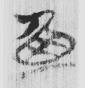廼
